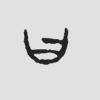曰
